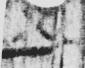之
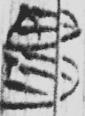胃（謂）
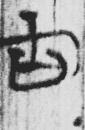古（故）
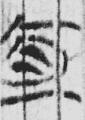宜（義）
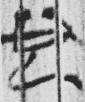也
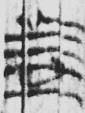者
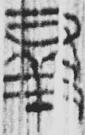群
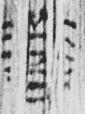善
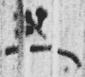之
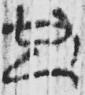也
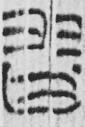習
